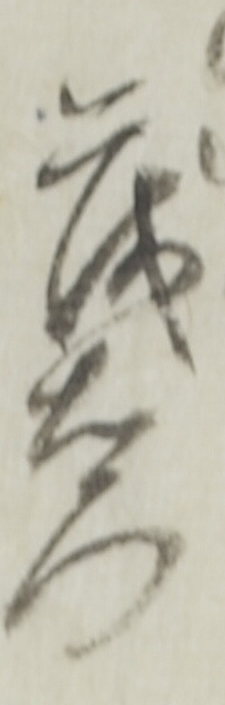茂右衛門
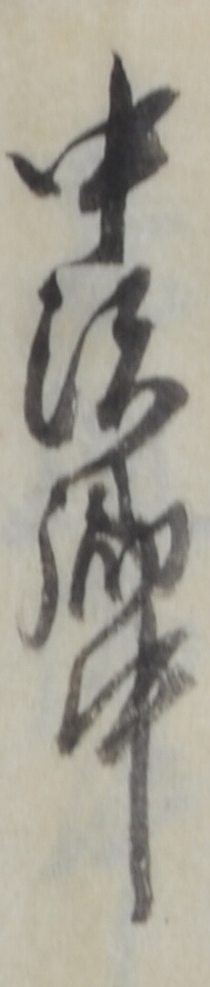藤沢郷中

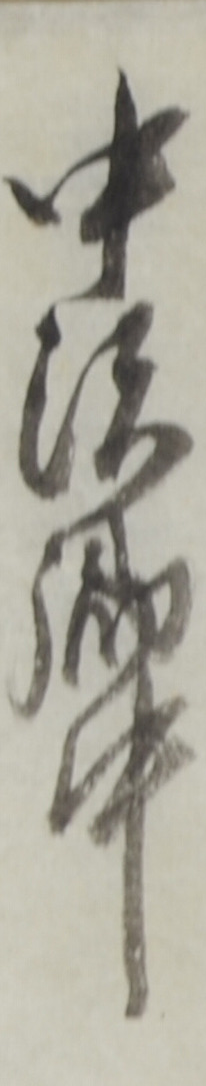中沢郷中
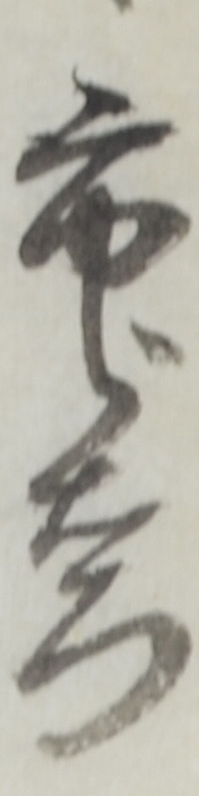市郎右衛門
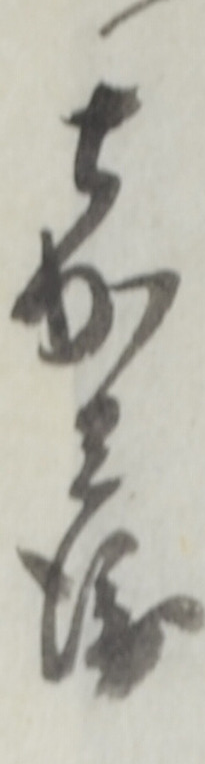嘉兵衛
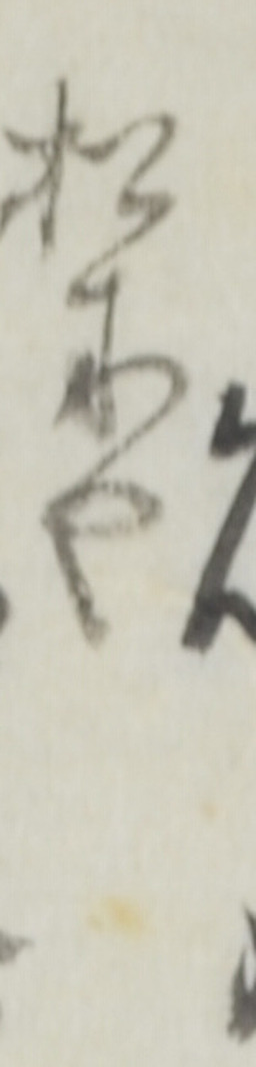松木や
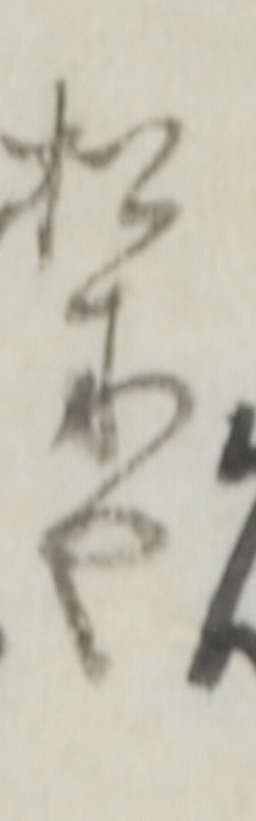松木や
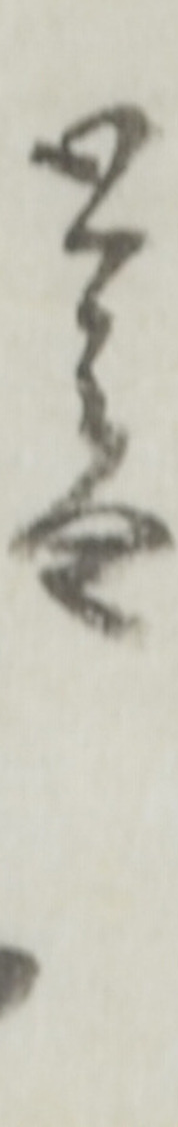とミや
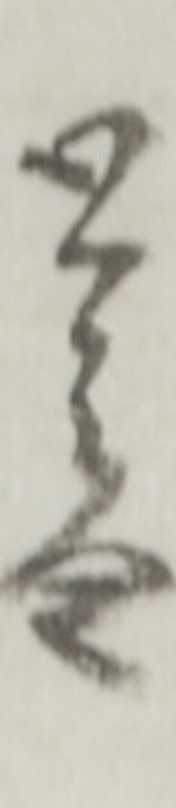とミや
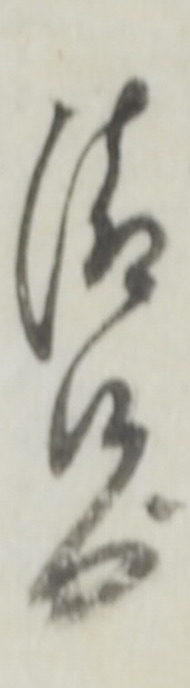嘉兵衛
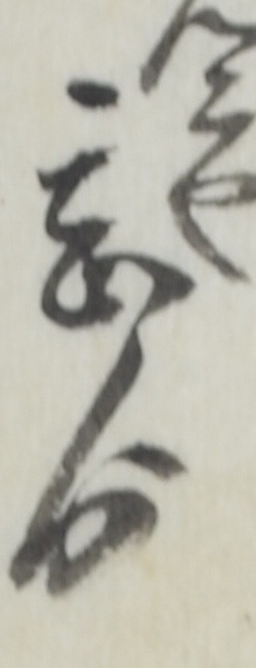甚右衛門

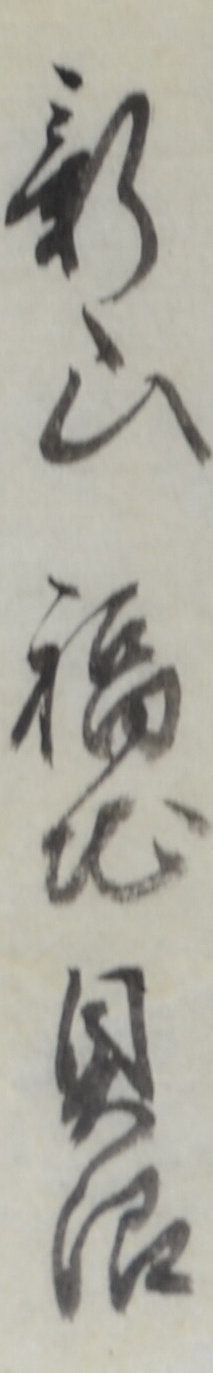新山福地貝沼
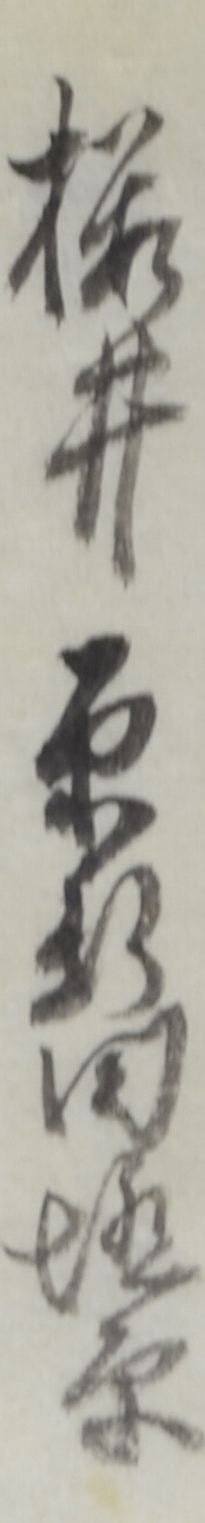桜井原新田埴原
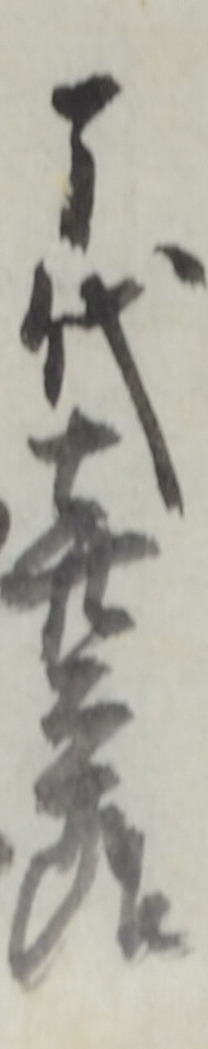丁代喜兵衛
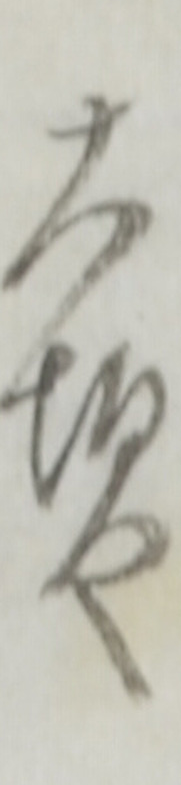大坂や
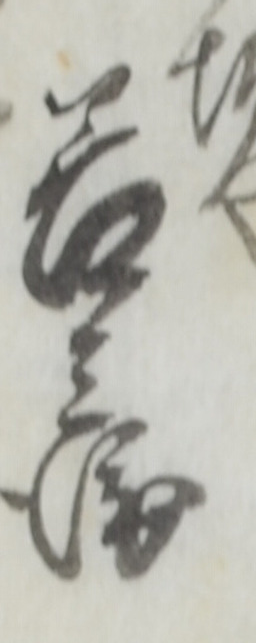善兵衛
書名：勧化人割帳
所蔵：伊那市立高遠町図書館・合同会社AMANE
